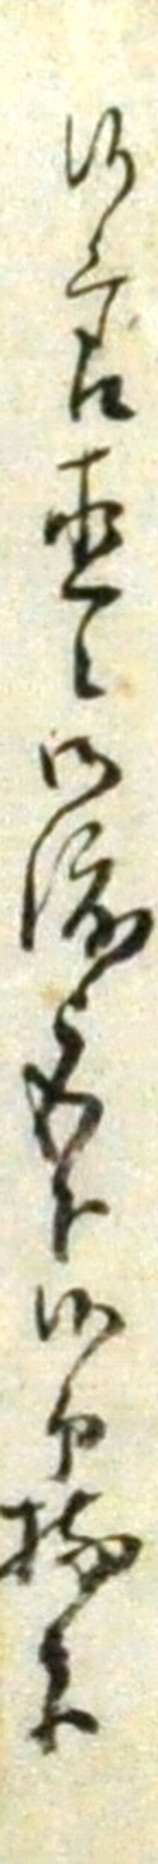候節、直ニ御渡被成下候而持参
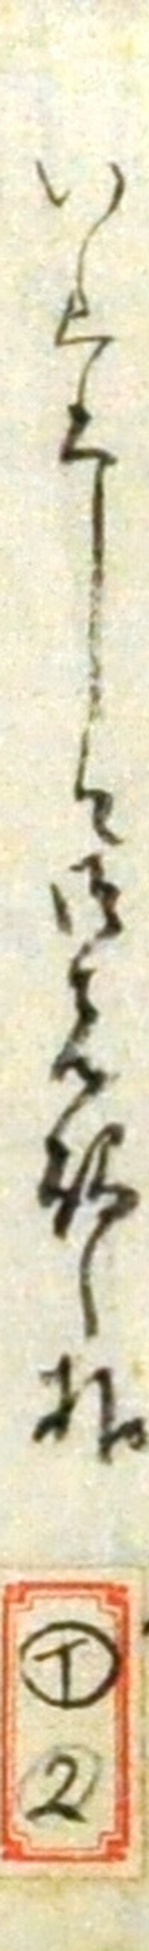いたし候御先触之様
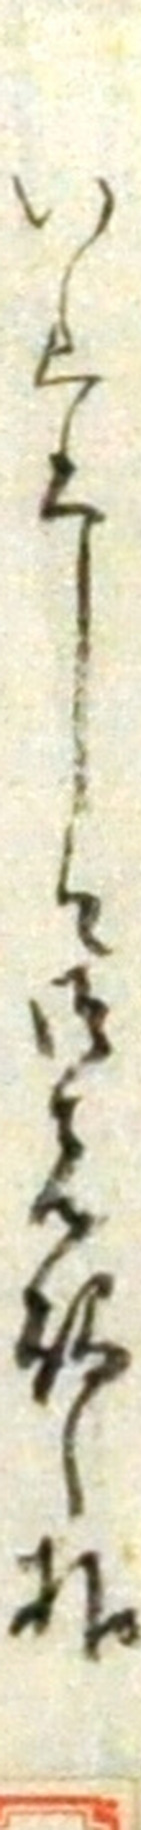いたし候御先触之様
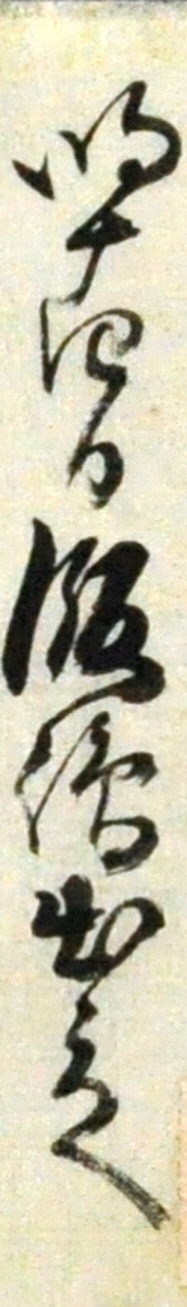明十四日飯嶋出立
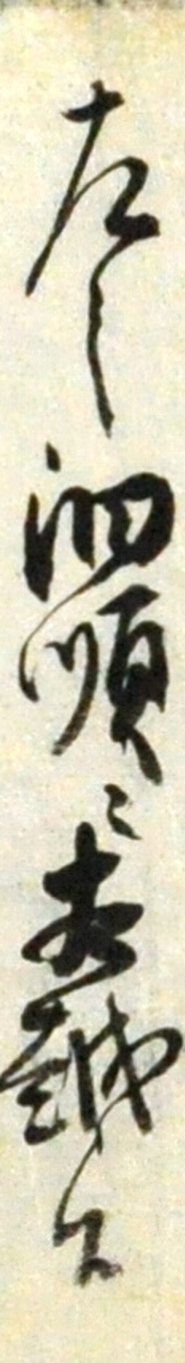左之泊順ニ相越候
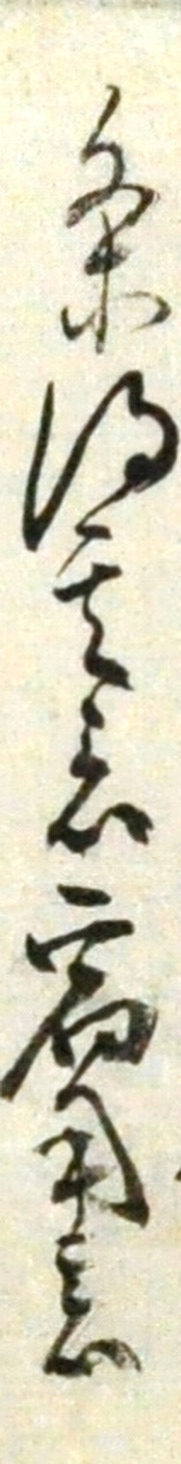条得其意宿用意
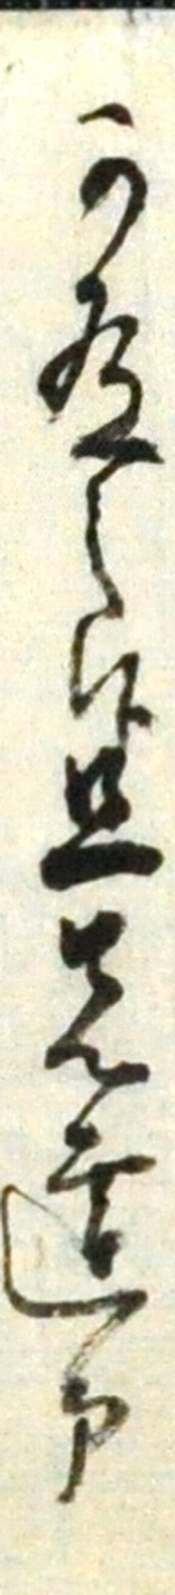可有之候且先達而
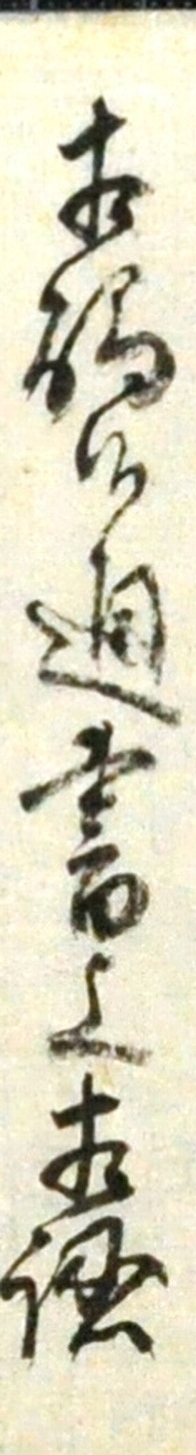相触候通書上相認
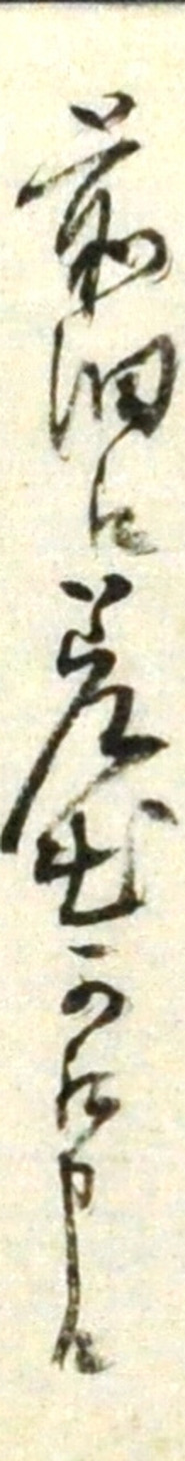前泊江差出可被申候
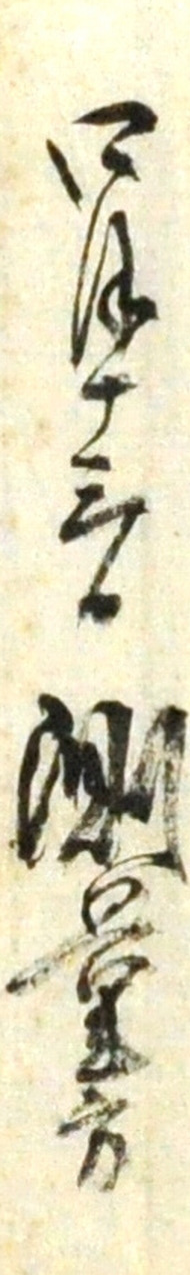四月十三日測量方
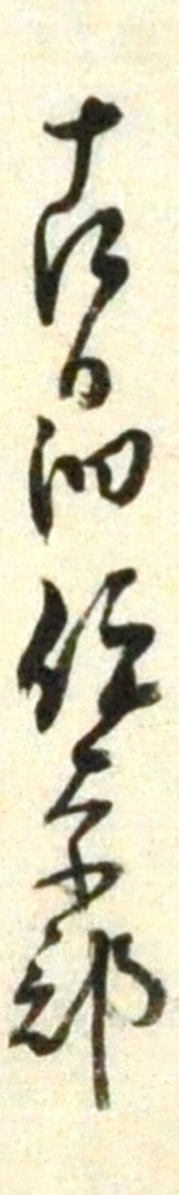十四日泊伊奈郡
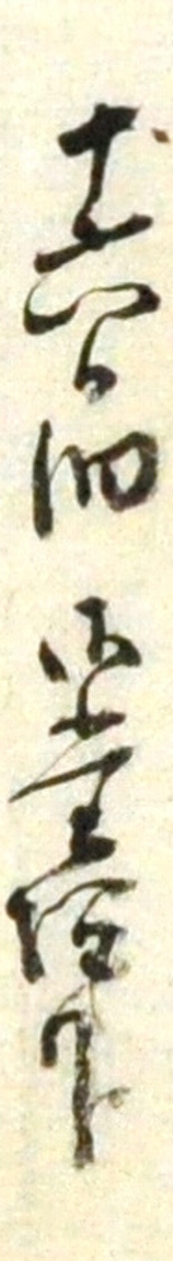十六日泊御堂垣外
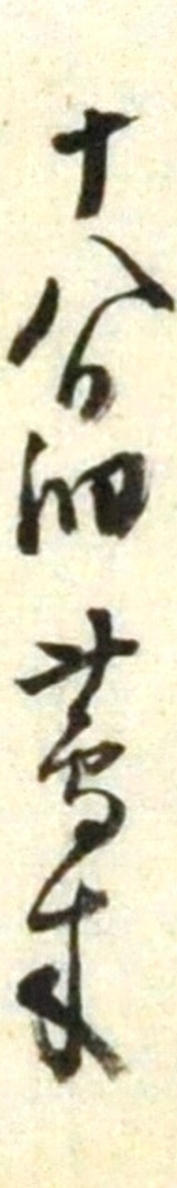十八日泊蔦木
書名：測量方御先触控
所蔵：伊那市立高遠町図書館・合同会社AMANE
